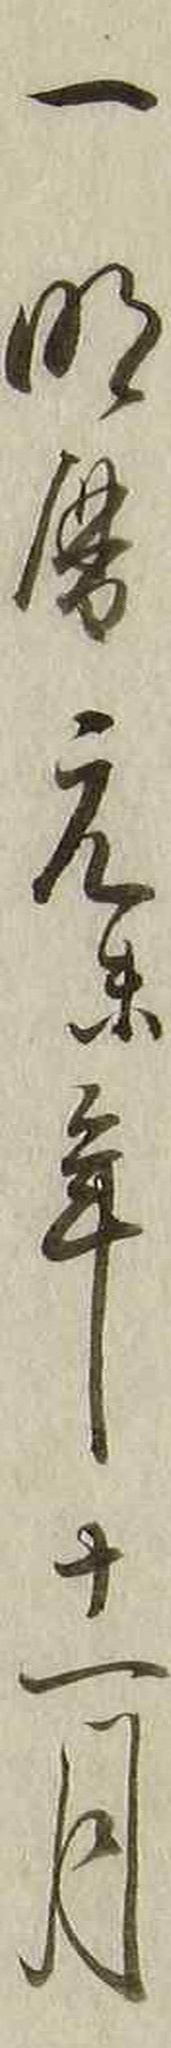一明暦元未年十一月
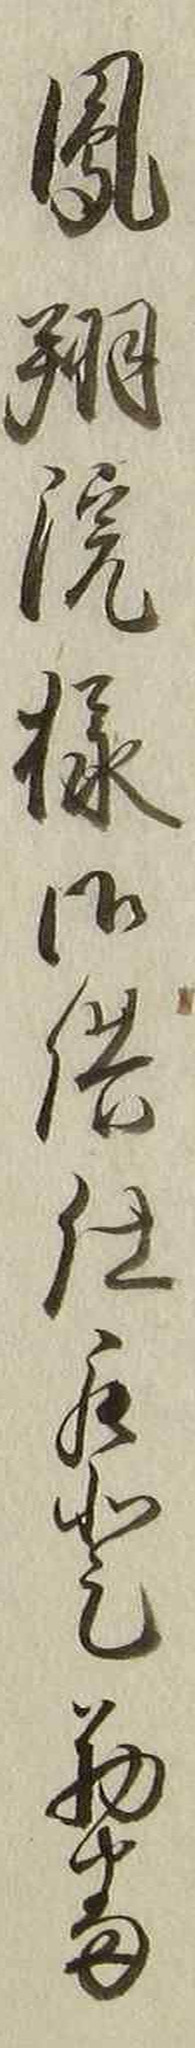鳳朔院様御供仕罷登勤番
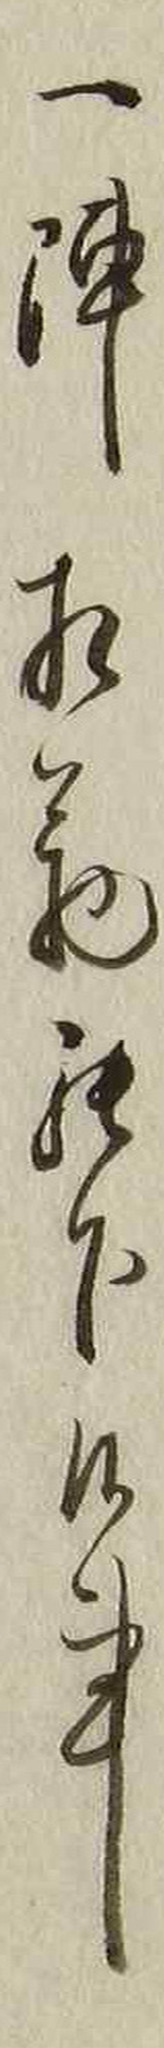一陣相勤罷下候事
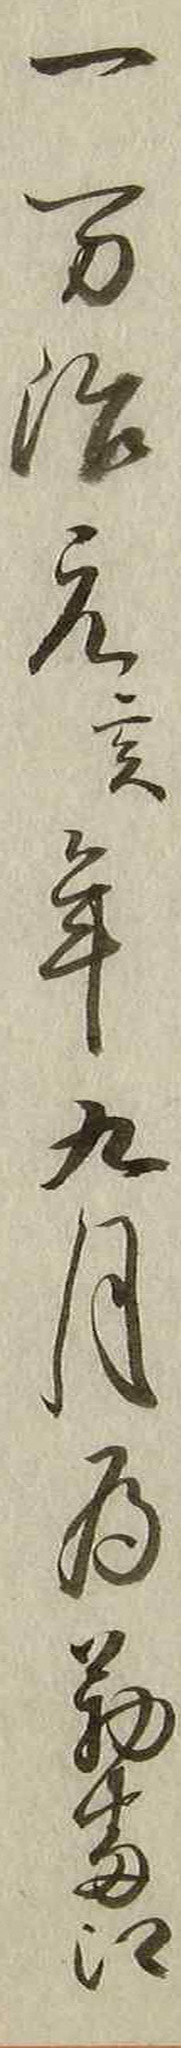一万治元亥年九月為勤番江
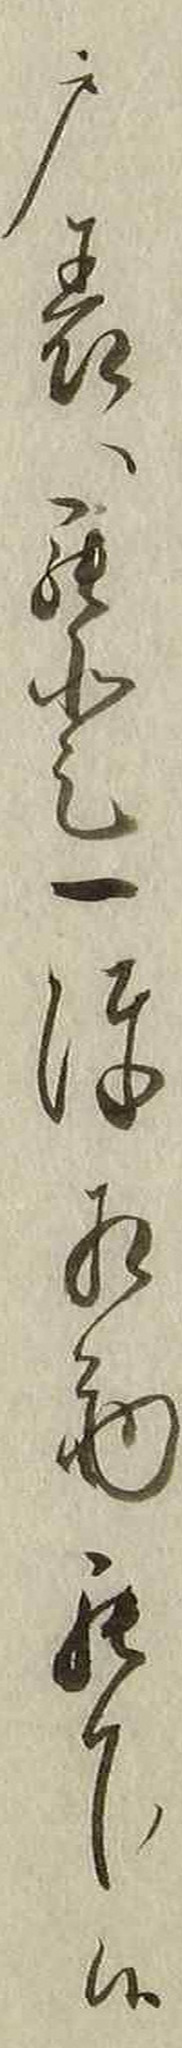戸表へ罷登一陣相勤罷下候
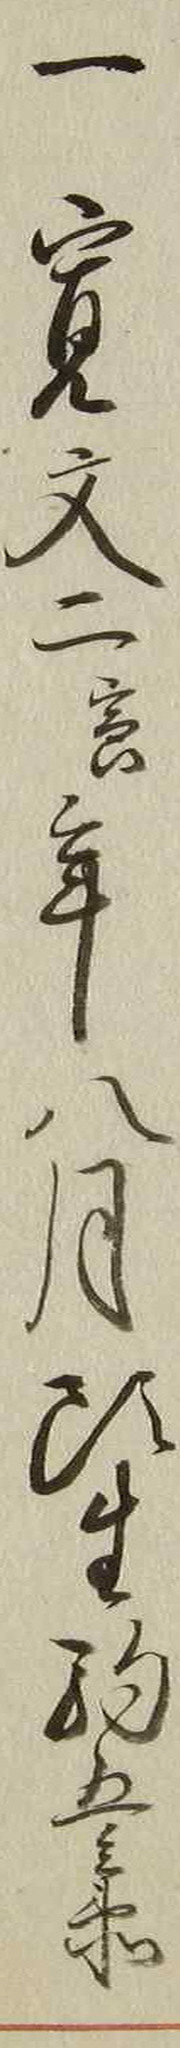一寛文二寅年八月頭生駒五兵衛
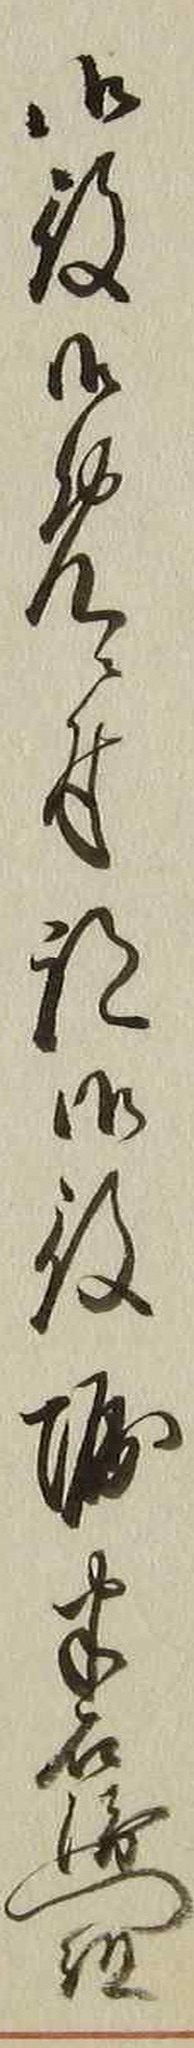御役御免ニ付跡御役堀半右衛門組
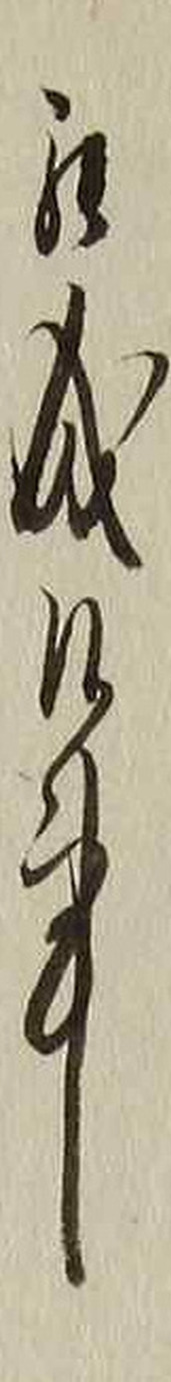罷成候事
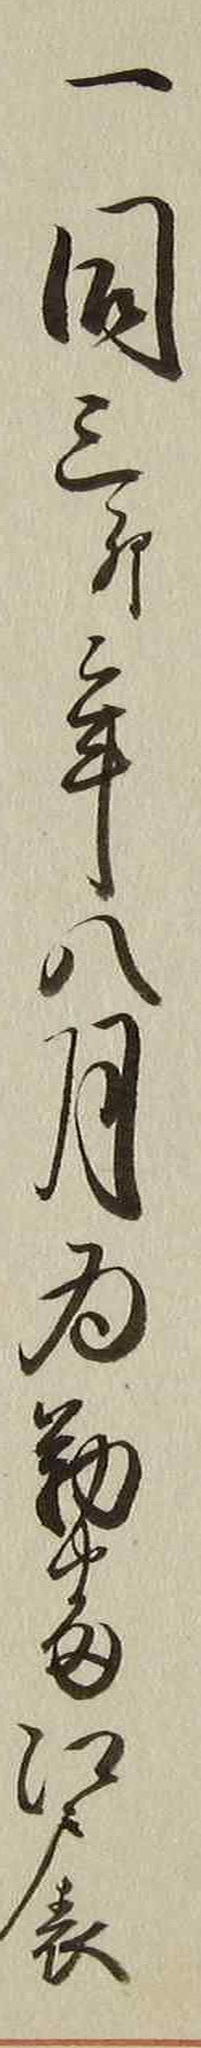一同三卯年八月為勤番江戸表
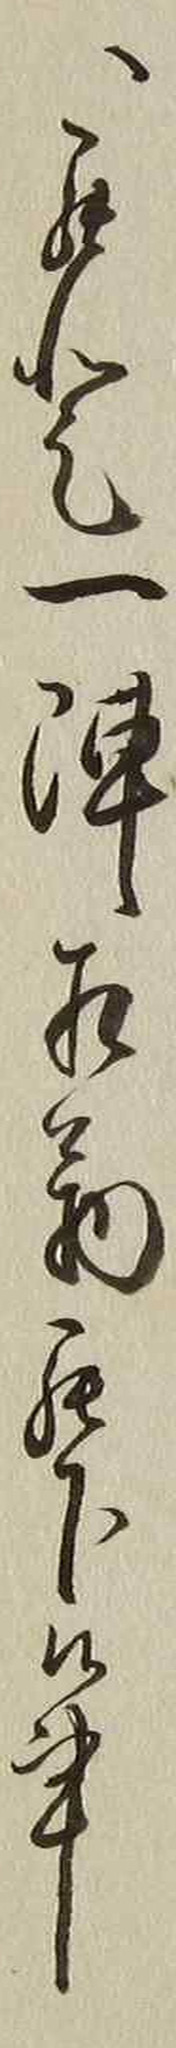へ罷登一陣相勤罷下候事
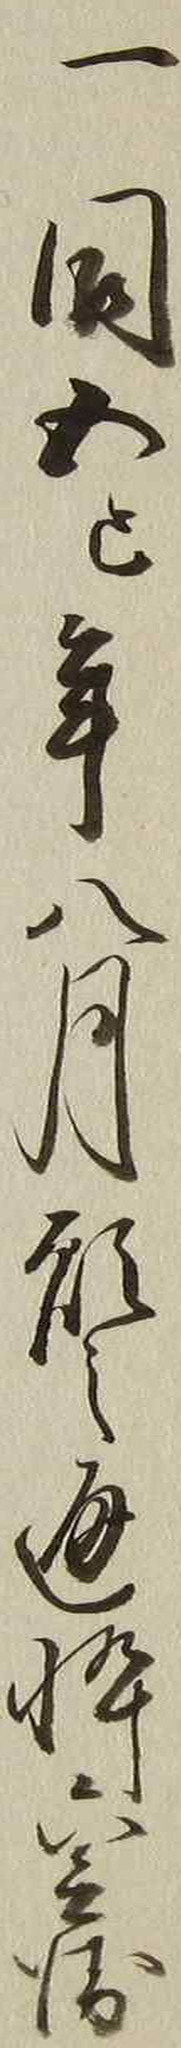一同五巳年八月願之通忰六兵衛
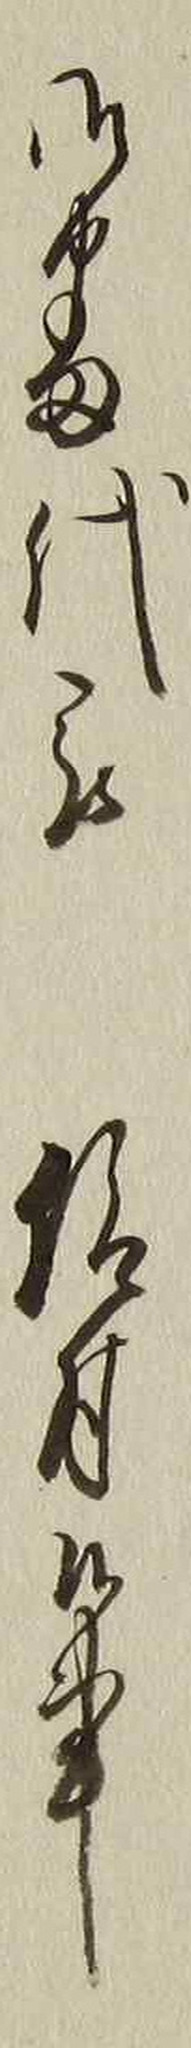御番代被仰付候事
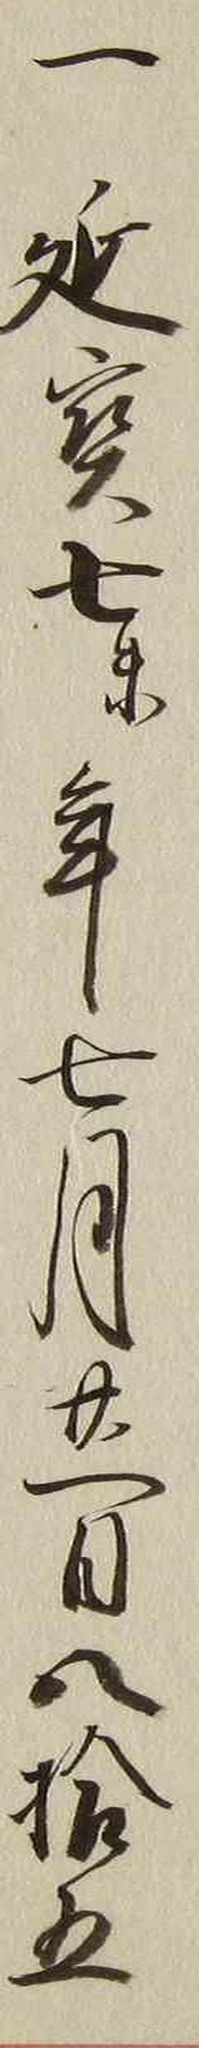一延宝七未年七月廿一日八拾五
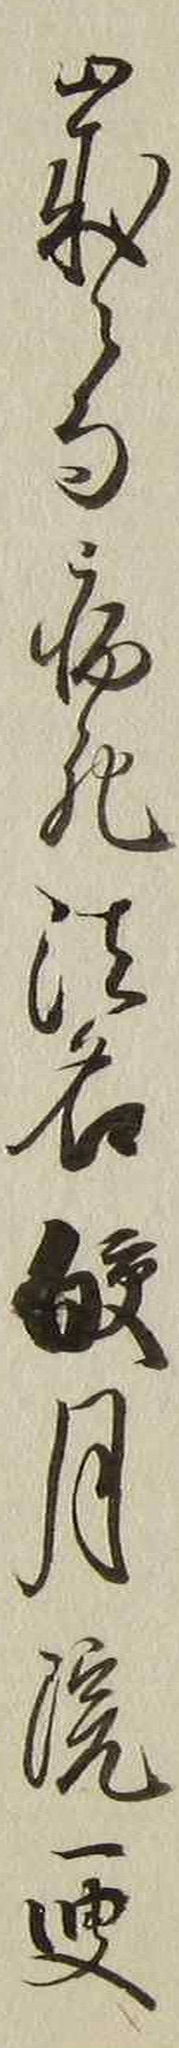歳ニ而病死法名皎月院一叟
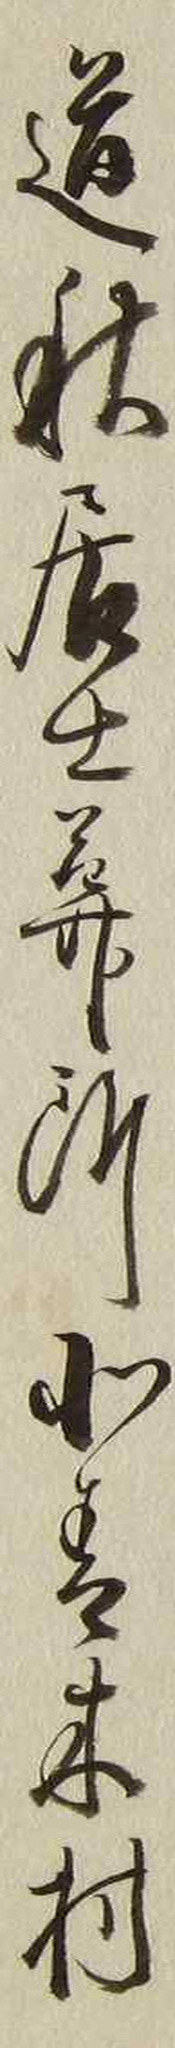道秋居士葬所北青木村
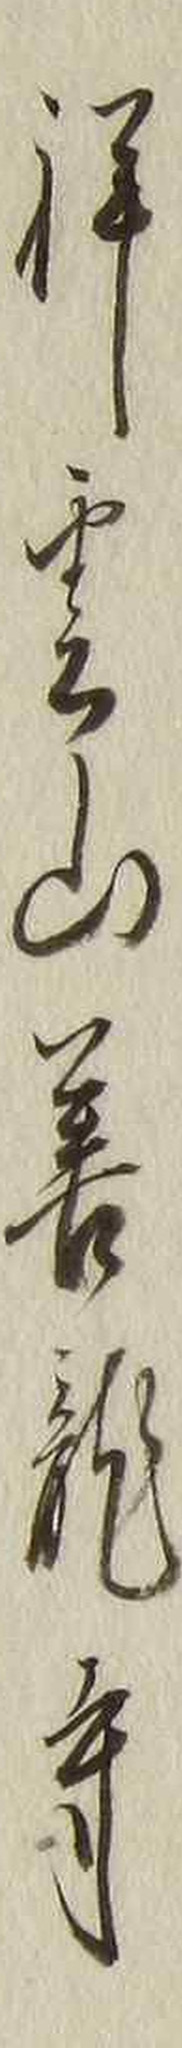祥雲山善龍寺
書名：諸士系譜　巻之18　い之部18
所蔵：会津若松市立会津図書館
